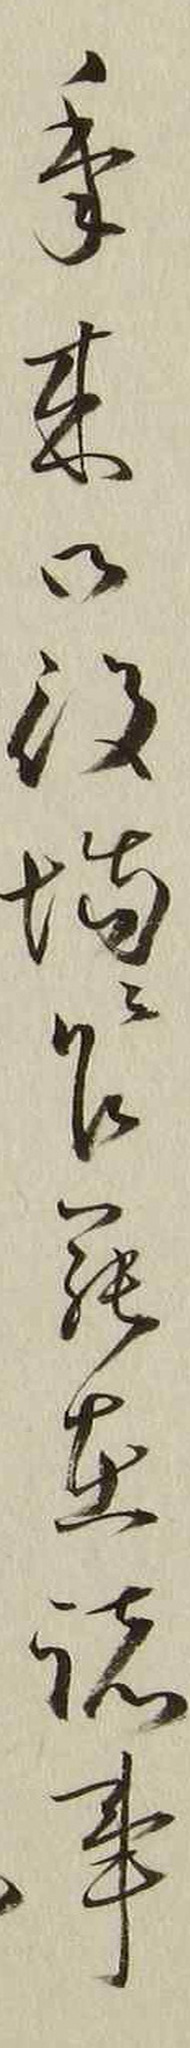年来御役場ニ乍罷在諸事
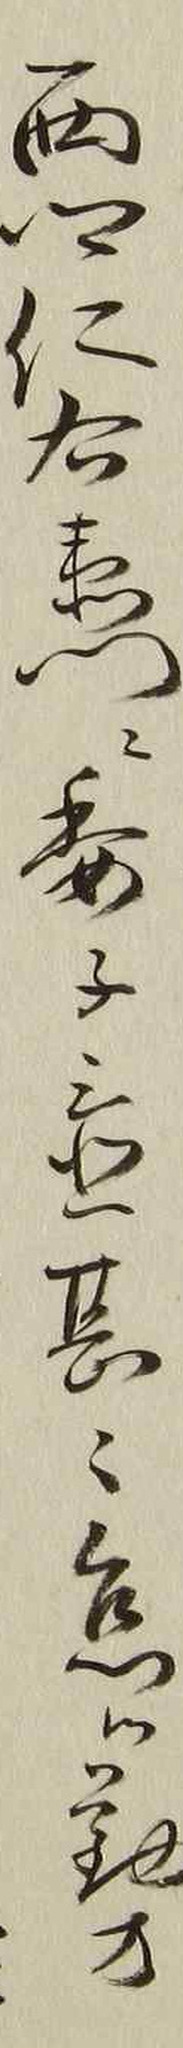西郷仁右衛門ニ委ね置甚々怠候勤方
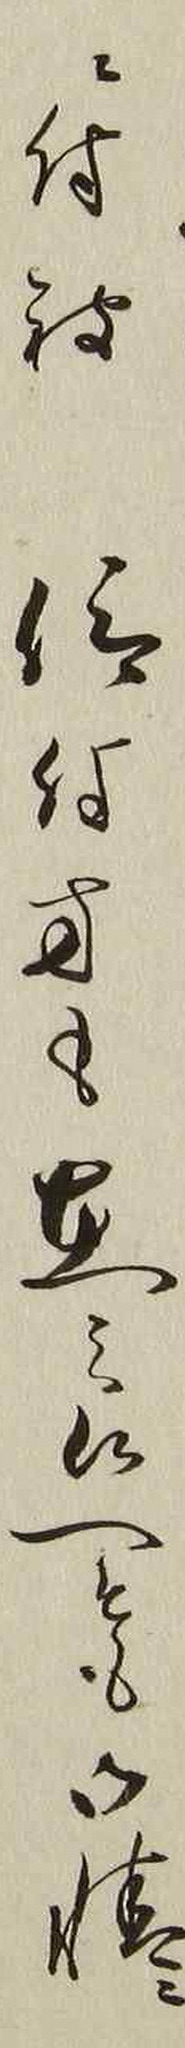ニ付被仰付方も在之候へとも御情ニ
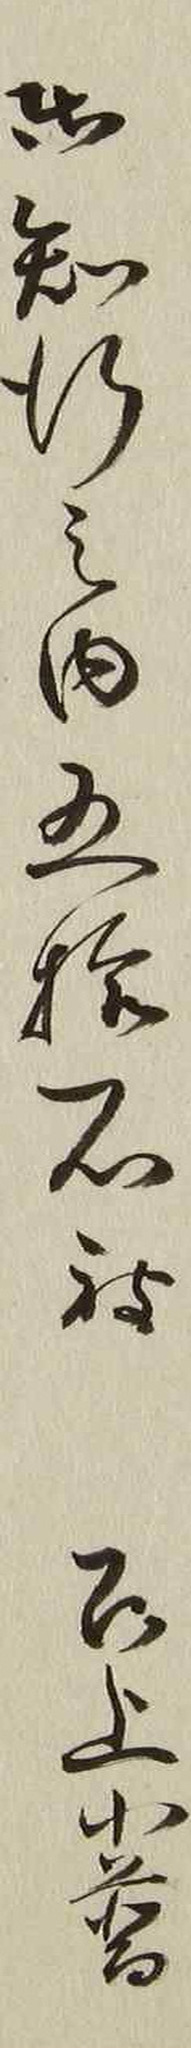御知行之内五拾石被召上小普
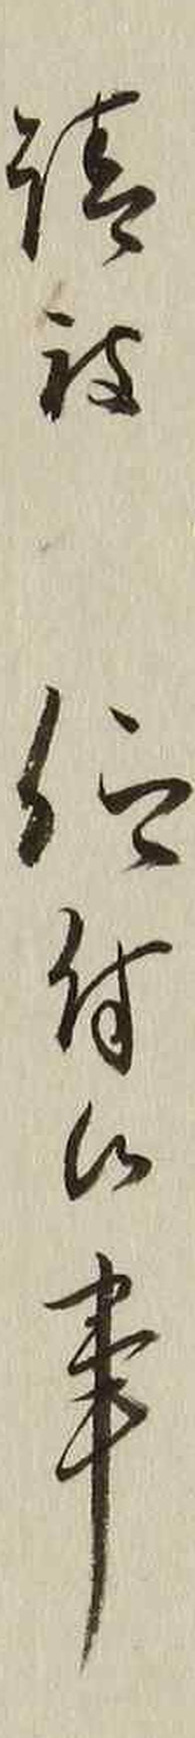請被仰付候事
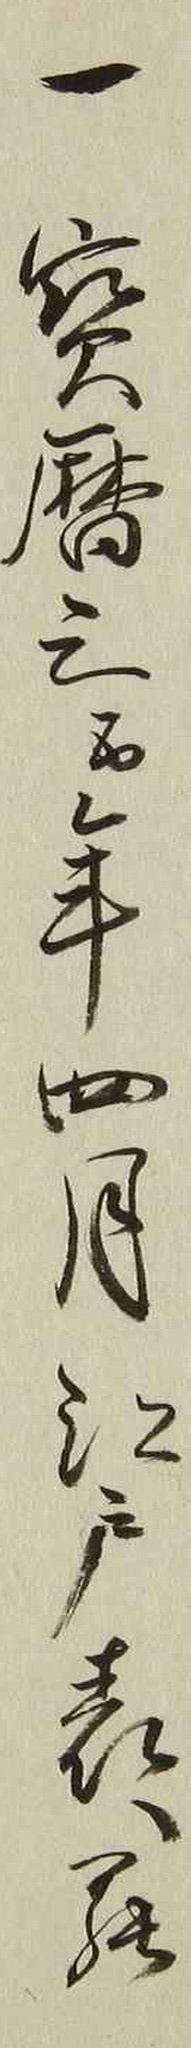一宝暦三酉年四月江戸表ㇸ罷
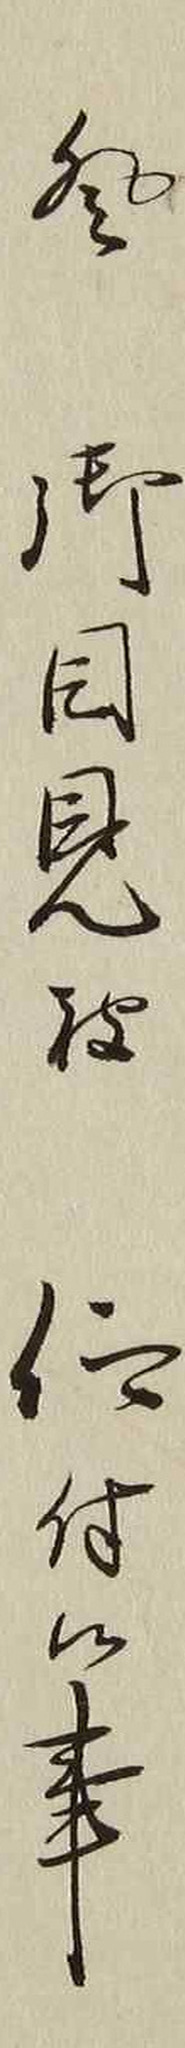登御目見被仰付候事
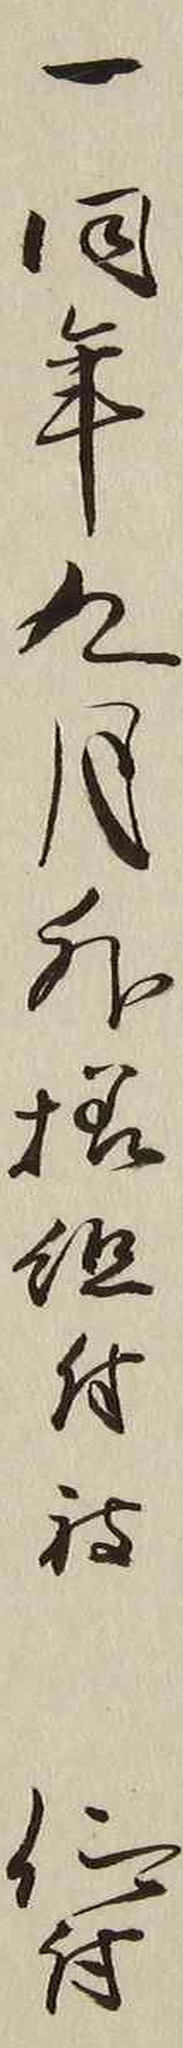一同年九月外様組付被仰付
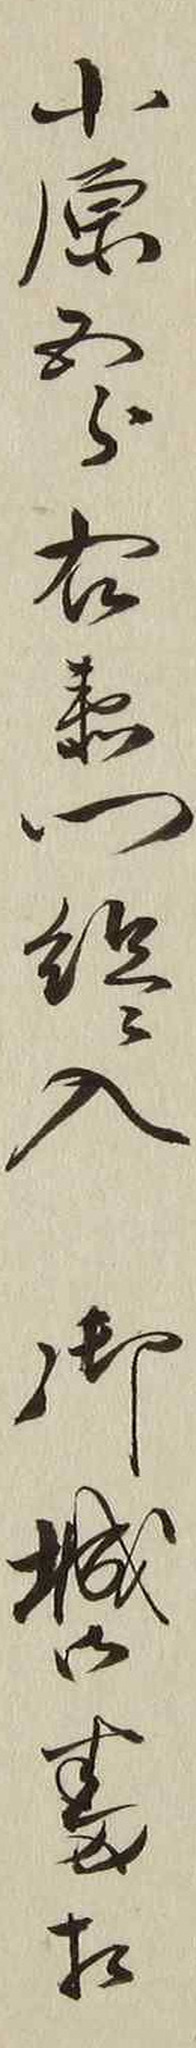小原五郎右衛門組ニ入御城御番相
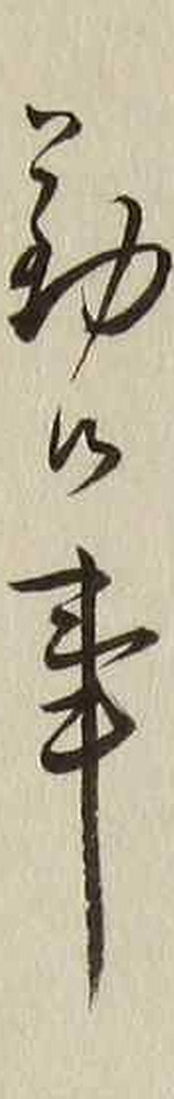勤候事
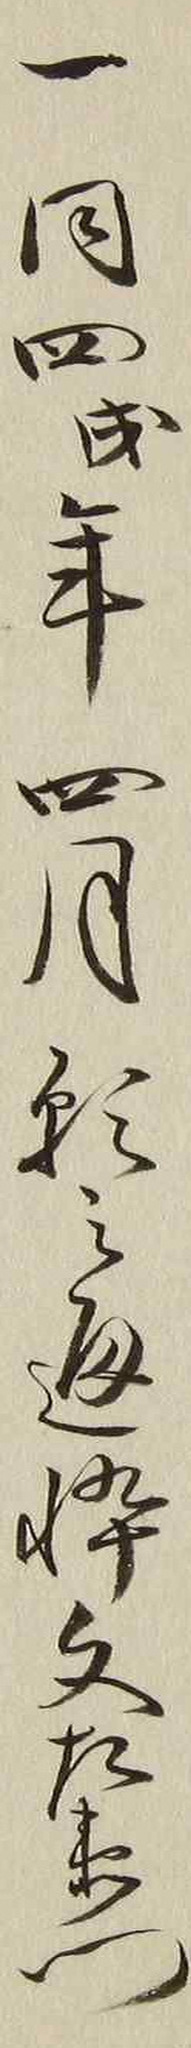一同四戌年四月願之通忰文左衛門
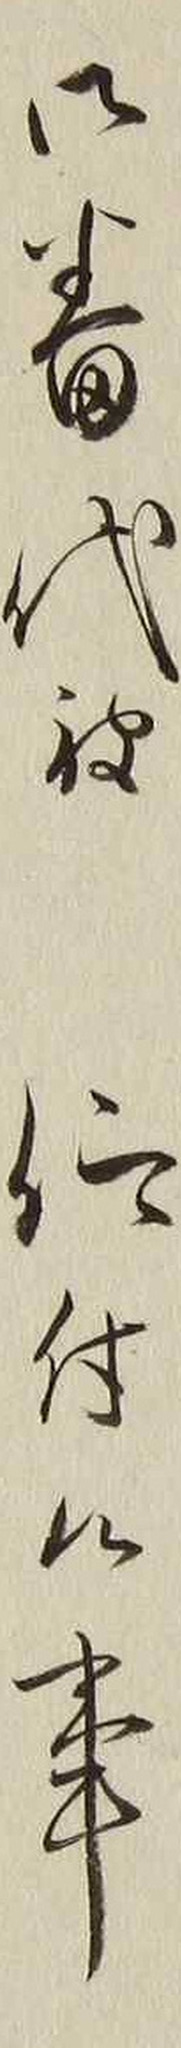御番代被仰付候事
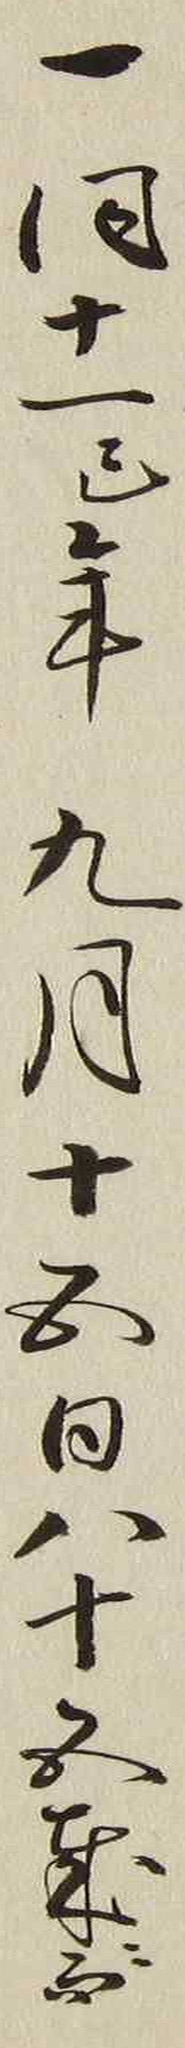一同十一巳年九月十五日八十五歳ニ而
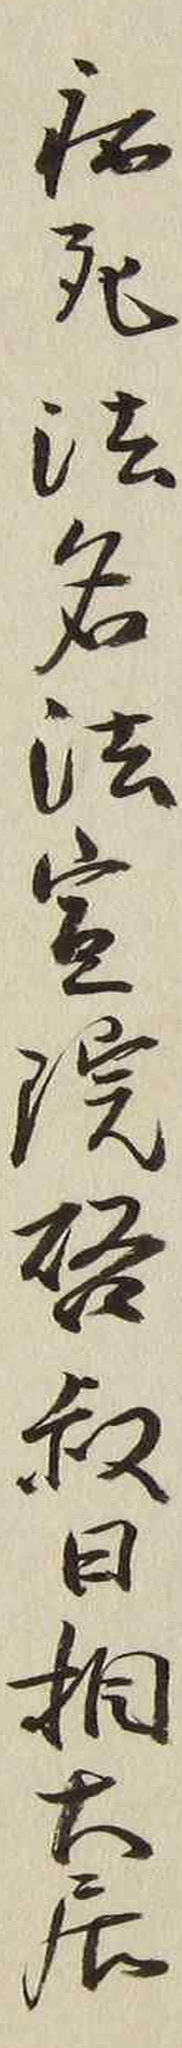病死法名法宜院啓叔日相大居
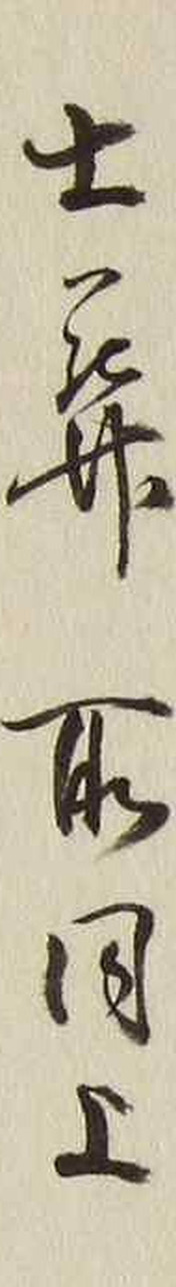士葬所同上

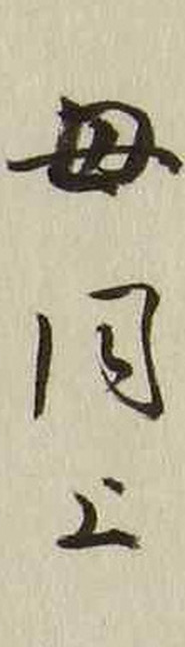母同上
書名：諸士系譜　巻之163　な之部5
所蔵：会津若松市立会津図書館
